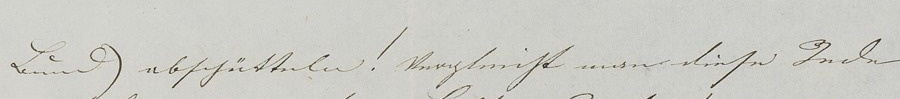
Bund) abschütteln!» Vergleicht man diese Rede
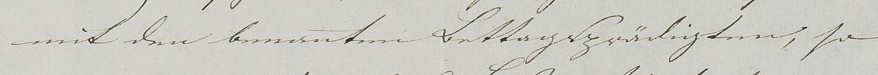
mit den benannten Bettagsprädigten, so
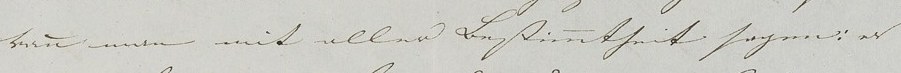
kann man mit aller Bestimmtheit sagen: es
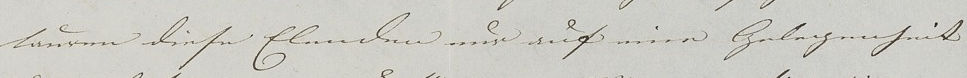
lauren diese Elenden nur auf eine Gelegenheit
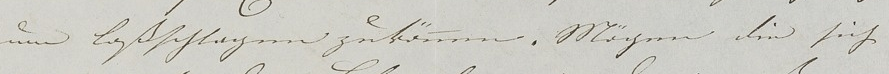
um loßschlagen zukönnen. Mögen die sich
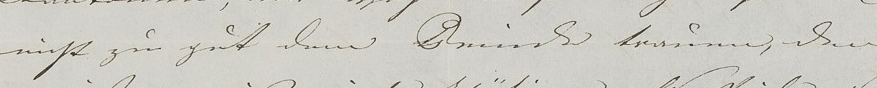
nicht zu gut dem Feinde trauen, den
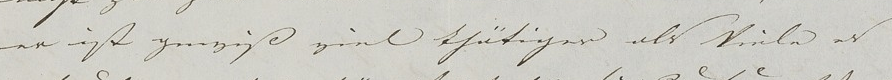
er ist gewiß viel thätiger als Viele es
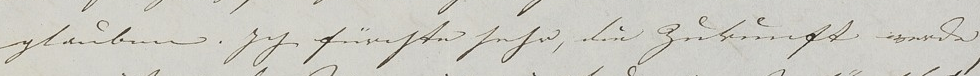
glauben. Ich fürchte sehr, die Zukunft werde
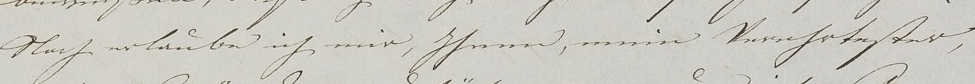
Noch erlaube ich mir, Ihnen, mein Verehrtester,
